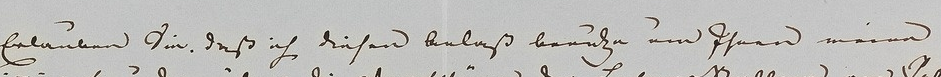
Erlauben Sie, daß ich diesen Anlaß benutze um Ihnen meine
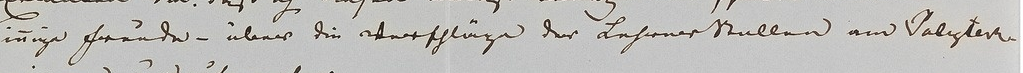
innige Freude – über die Vorschläge der LehrerStellen am Polytech-
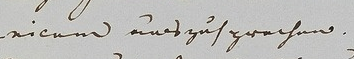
nicum auszusprechen.
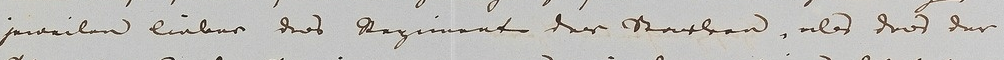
jeweilen lieber das Regiment der Starken, als das der
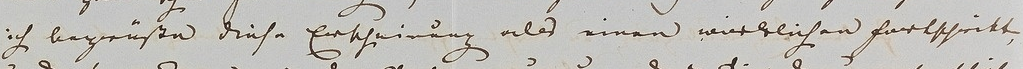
ich begrüße diese Erscheinung als einen wirklichen Fortschritt,
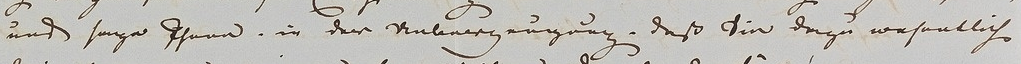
und sage Ihnen – in der Ueberzeugung – daß Sie dazu wesentlich
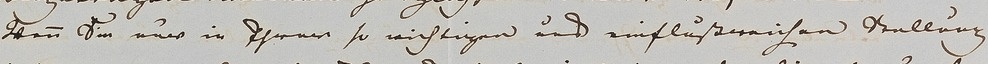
Wenn Sie nur in Ihrer so wichtigen und einflußreichen Stellung
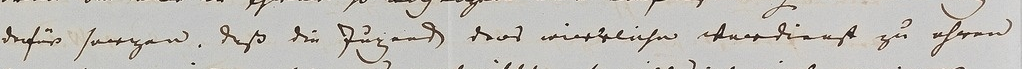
dafür sorgen, daß die Jugend das wirkliche Verdienst zu ehren
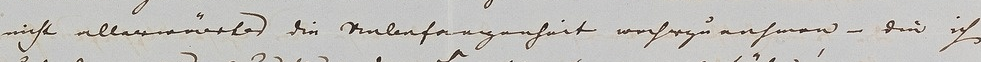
nicht allerwärts die Unbefangenheit wahrzunehmen – die ich
